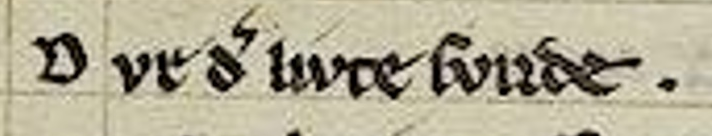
Dvr d(er) livte ſvnde.
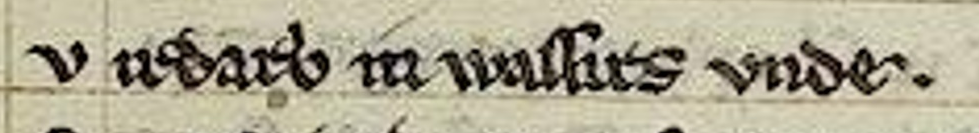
Virdarb in waſſirs vnde.
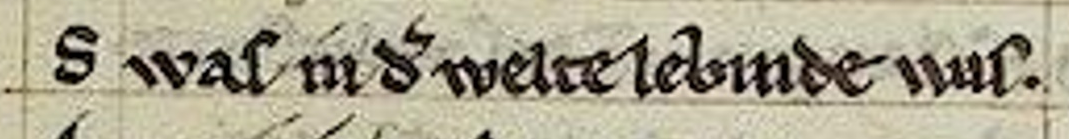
Swaſ in d(er) welte lebinde waſ.
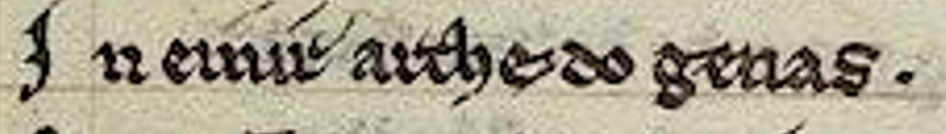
In einir arche do genas.
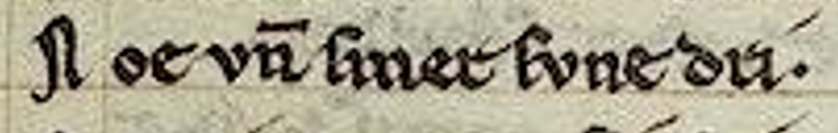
Noe vn(d) ſiner ſvne dri.
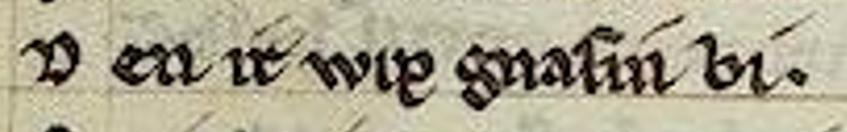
Den ir wip gnaſin bi.
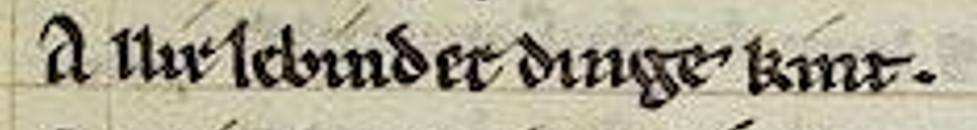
Allir lebinder dinge kint.
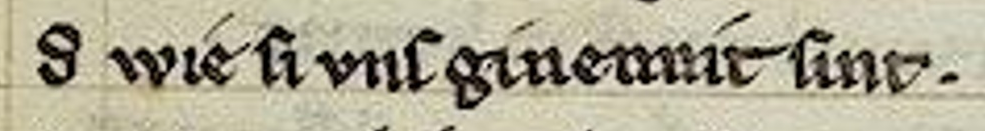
Swie ſi vnſ ginennit ſint.
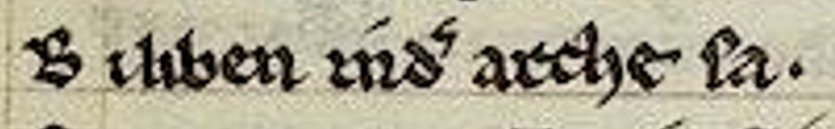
Biliben ind(er) arche ſa.
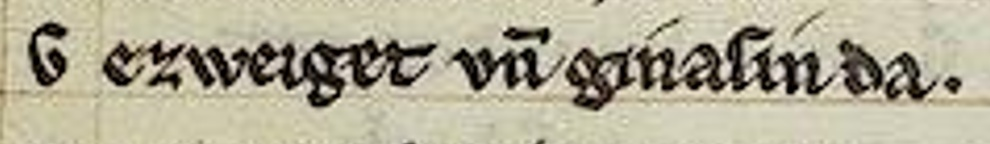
Gezweiget vn(d) ginaſin da.
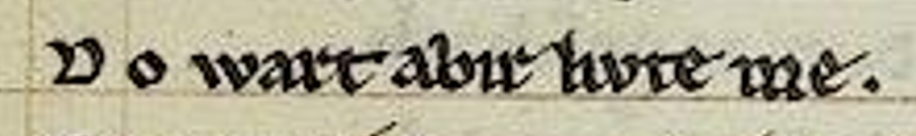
Do wart abir livte me.
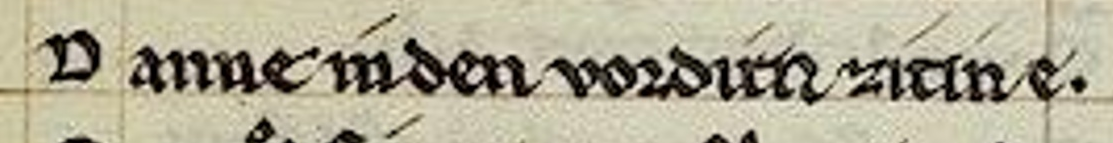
Danne in den vordirn zitin e.
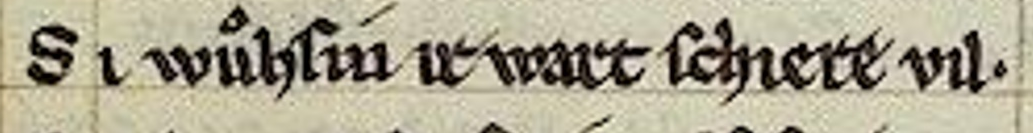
Si wu°ohſin ir wart ſchiere vil.
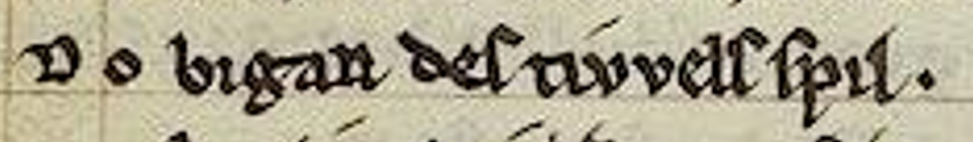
Do bigan deſ tivvelſ ſpil.
